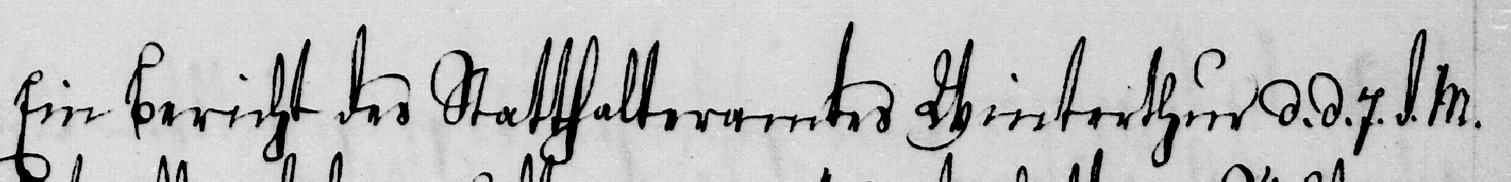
Ein Bericht des Statthalteramtes Winterthur d. d. 7. d.
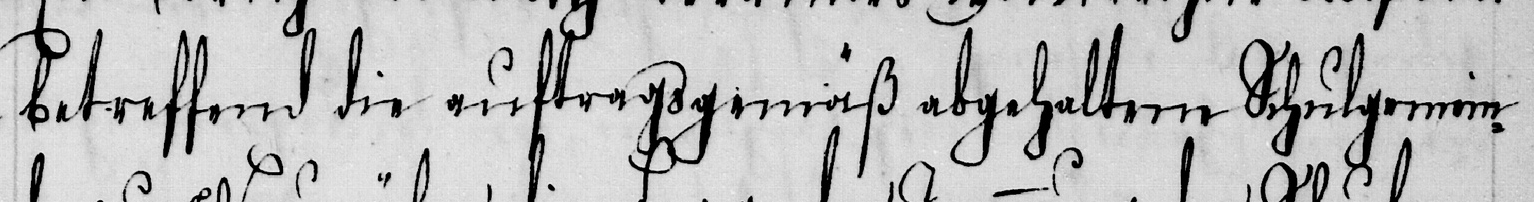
betreffend die auftragsgemäß abgehaltene Schulgemein¬
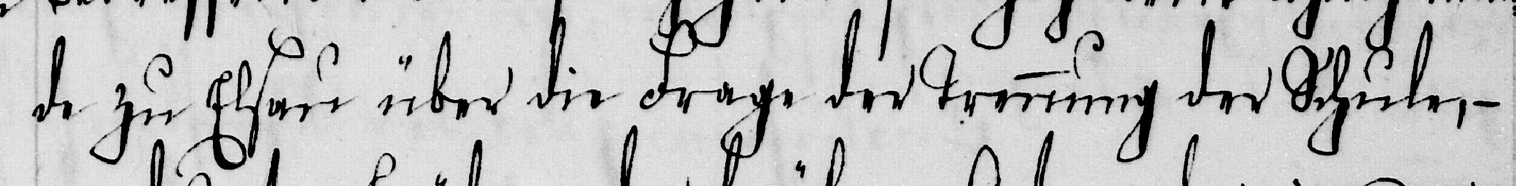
de zu Elsau über die Frage der Trennung der Schule,
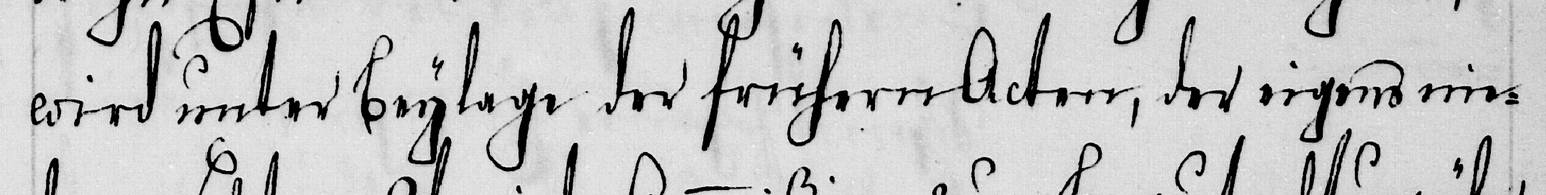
wird unter Beylage der frühern Acten, der eigens nie¬
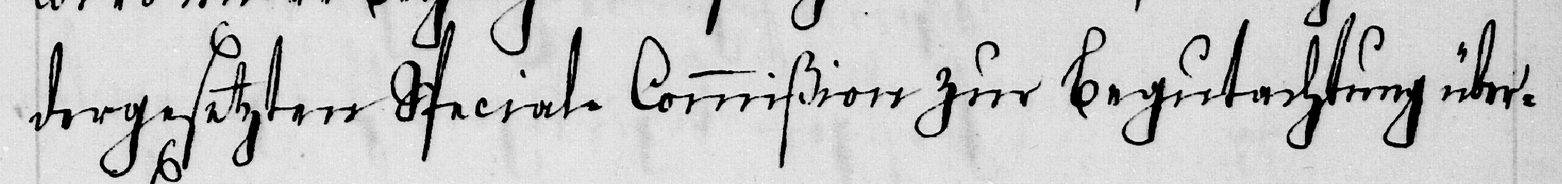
dergesetzten Special-Commißion zur Begutachtung über¬
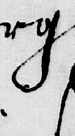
4.
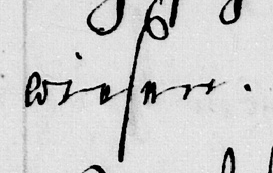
wiesen.
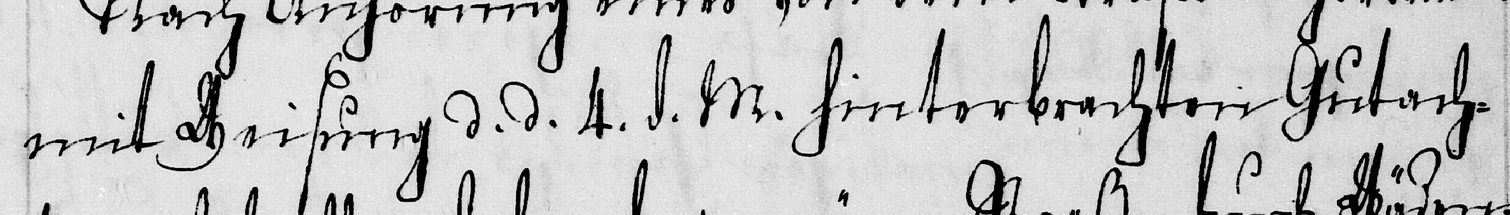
mit Weisung d. d. 4. d. M. hinterbrachten Gutach¬
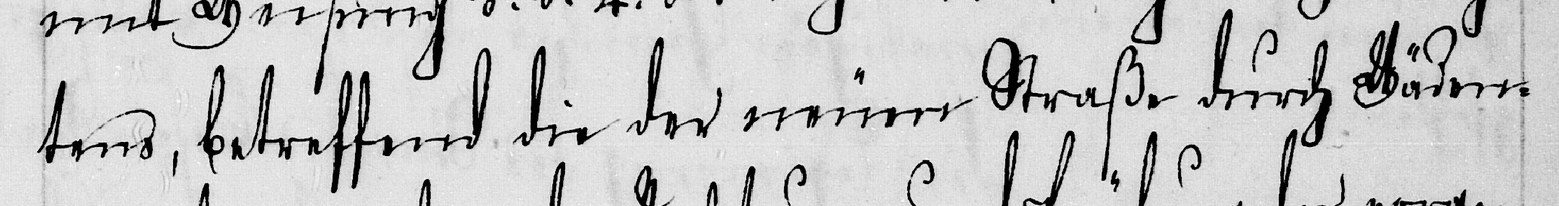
tens, betreffend die der neuen Straße durch Wäden¬
